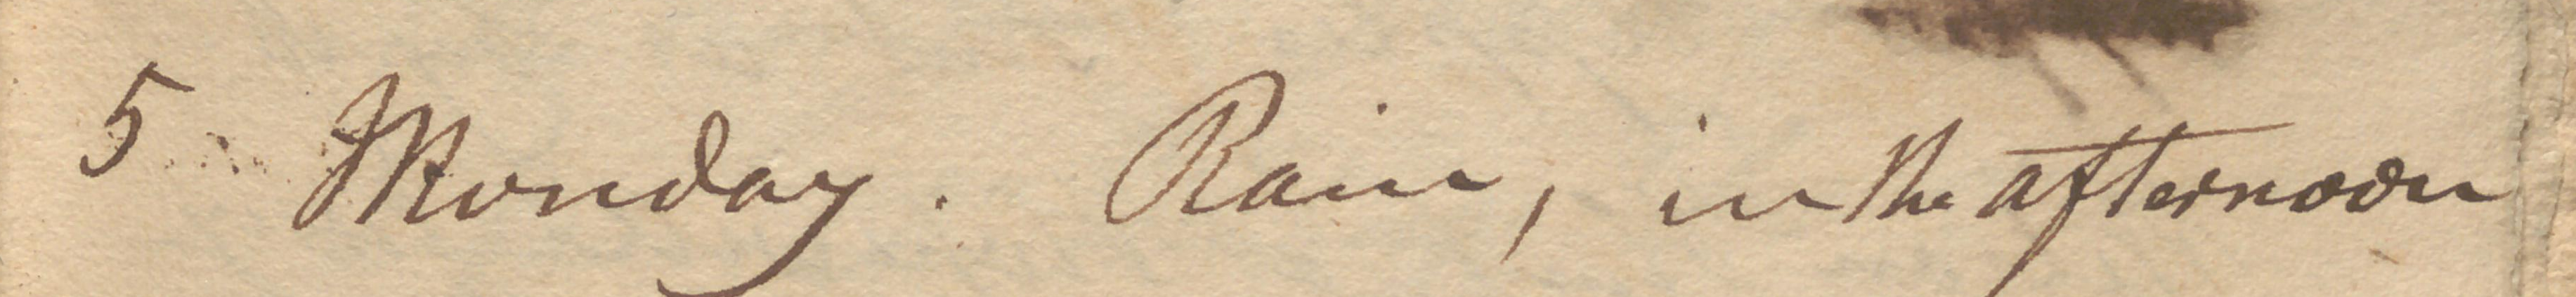5 Monday. Rain, in the afternoon
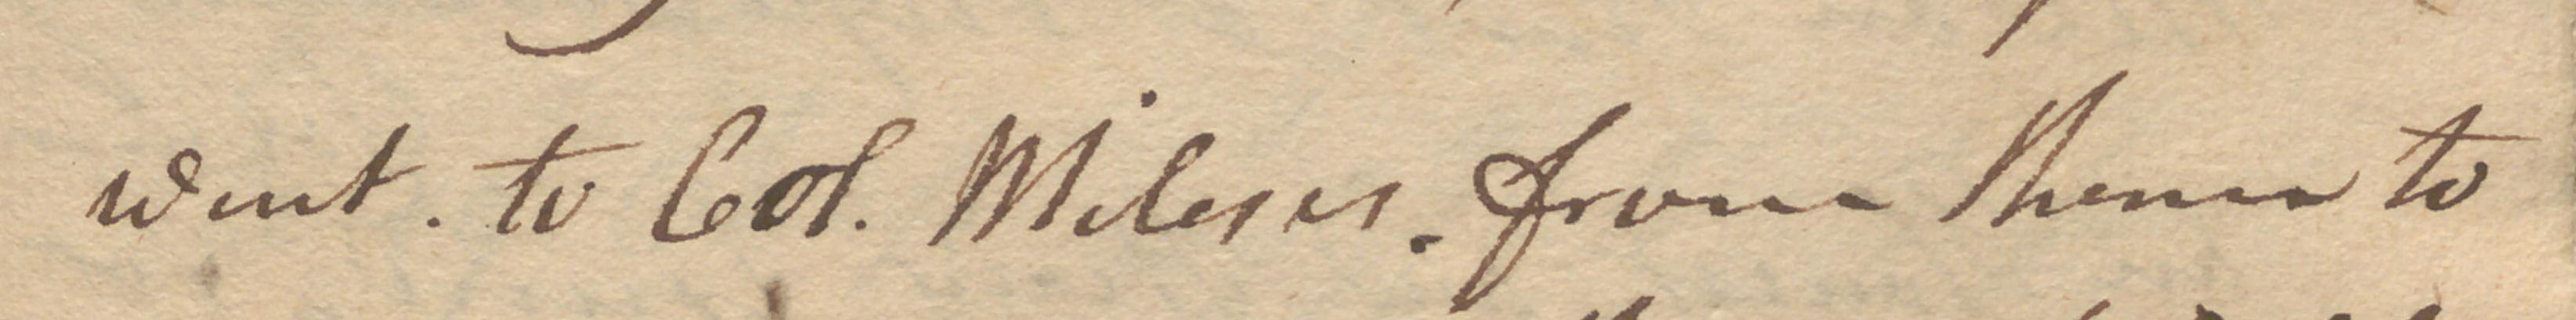went to Col. Mileses from thence to
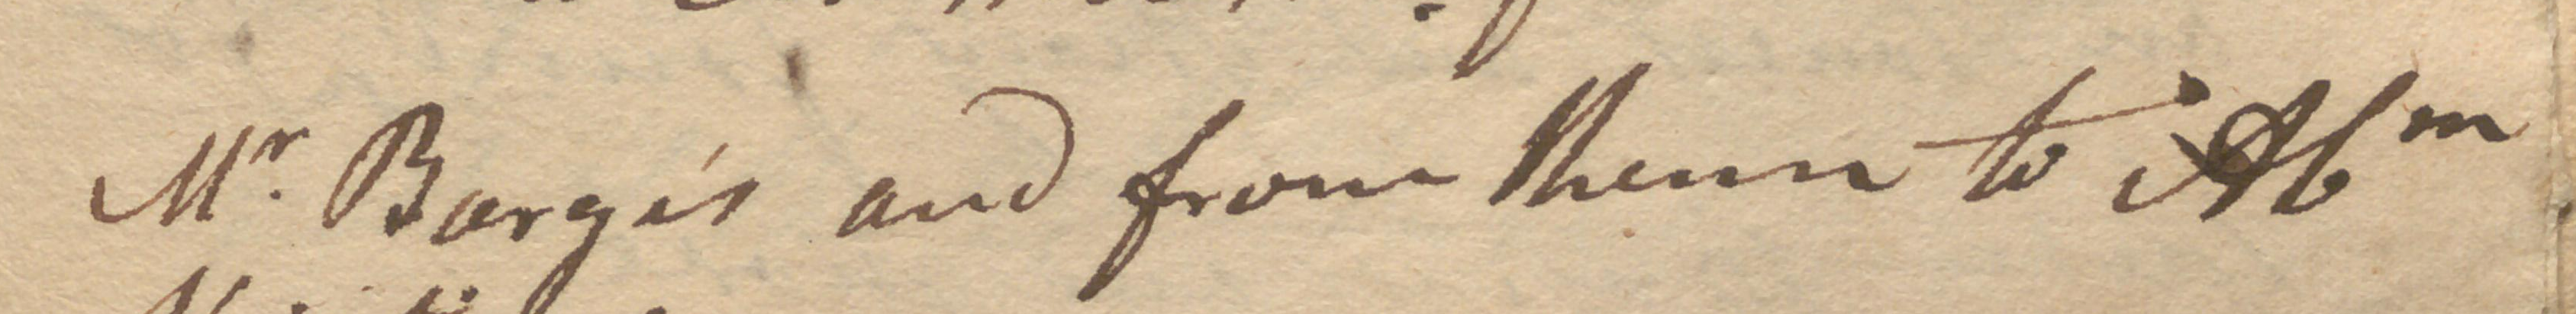M^r Barges and from thence to Ab^m
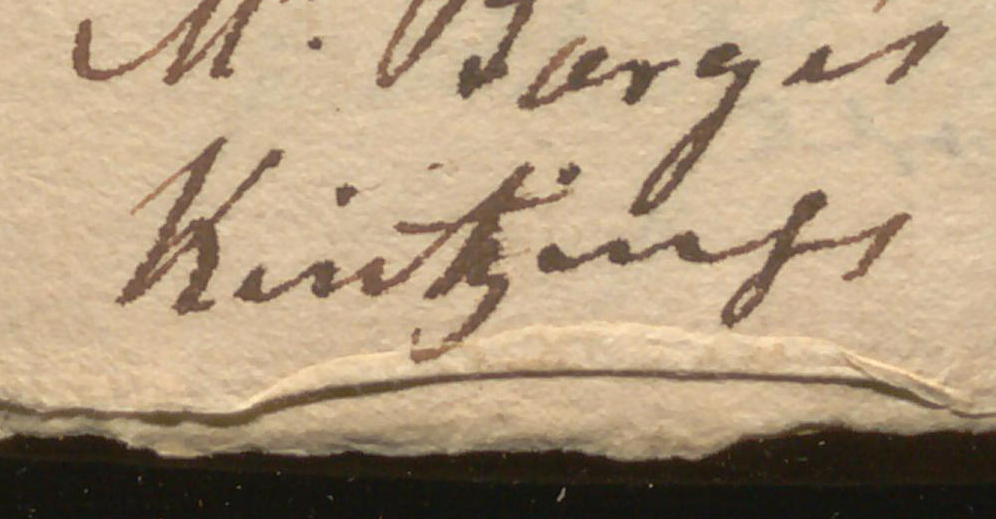Kintzings
